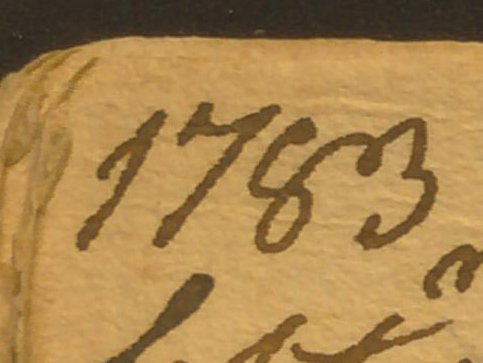1783
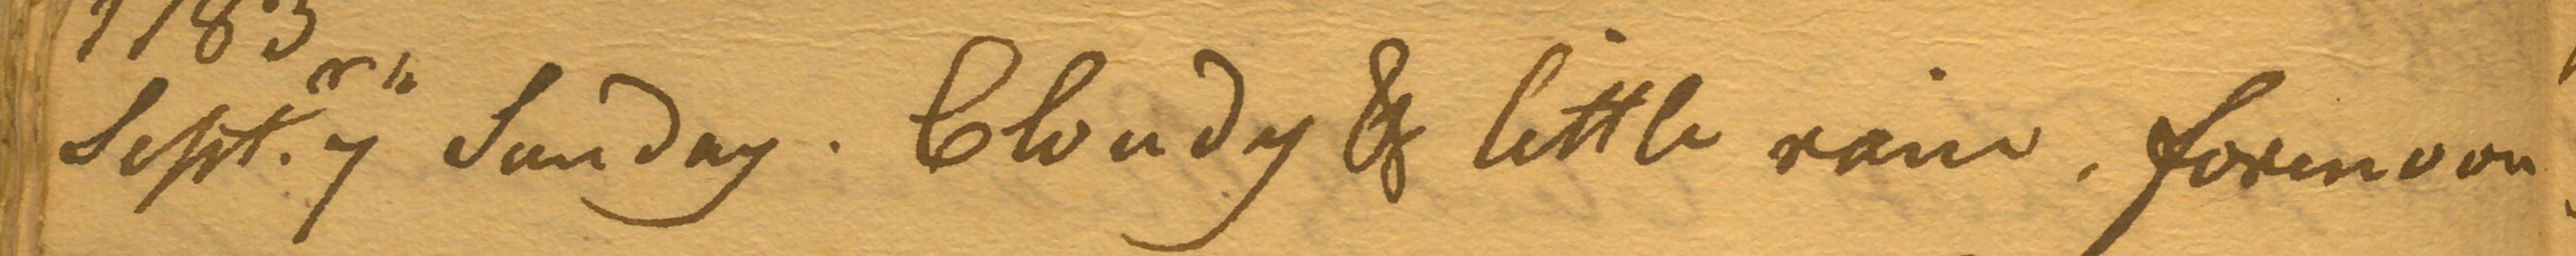Sept^r. 7^th Sunday. Cloudy & little rain, forenoon
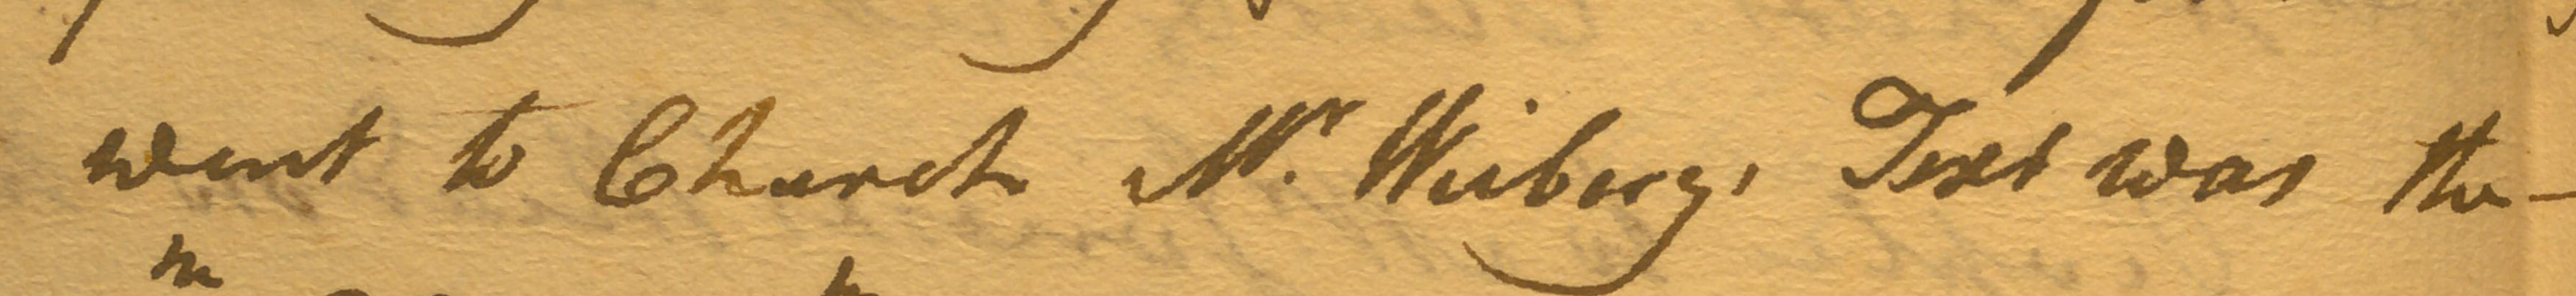went to Church M^r. Weibergs Text was the
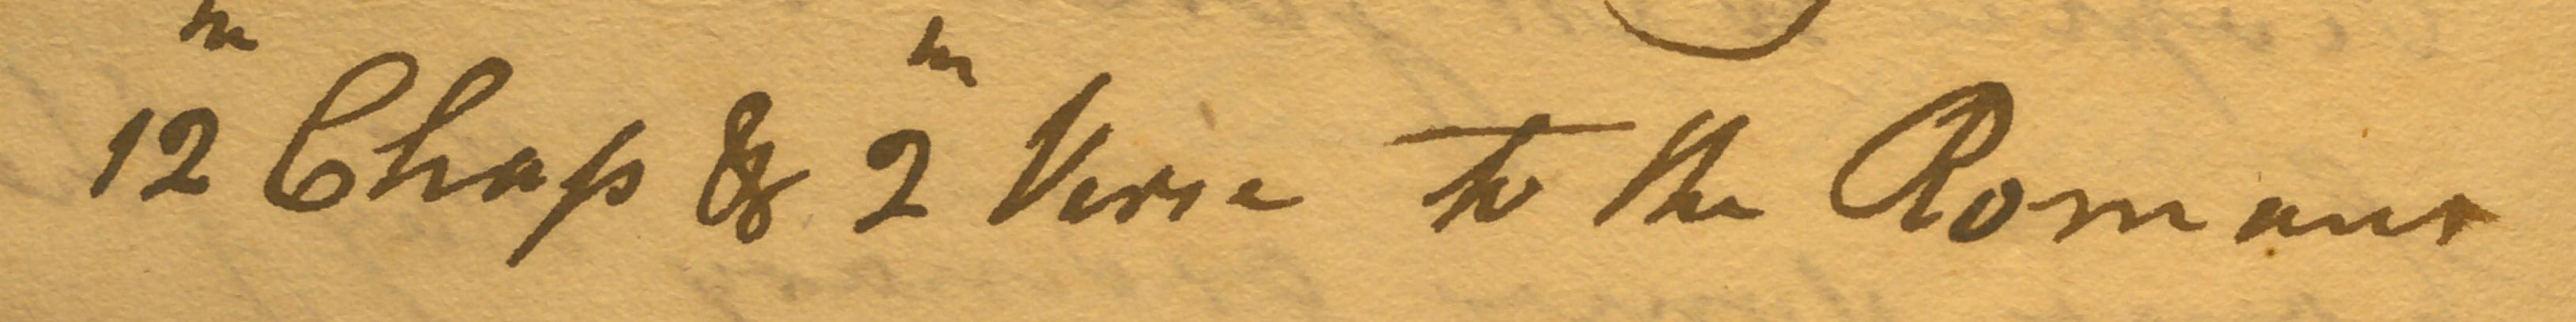12^th Chap & 2^th Verse to the Romans
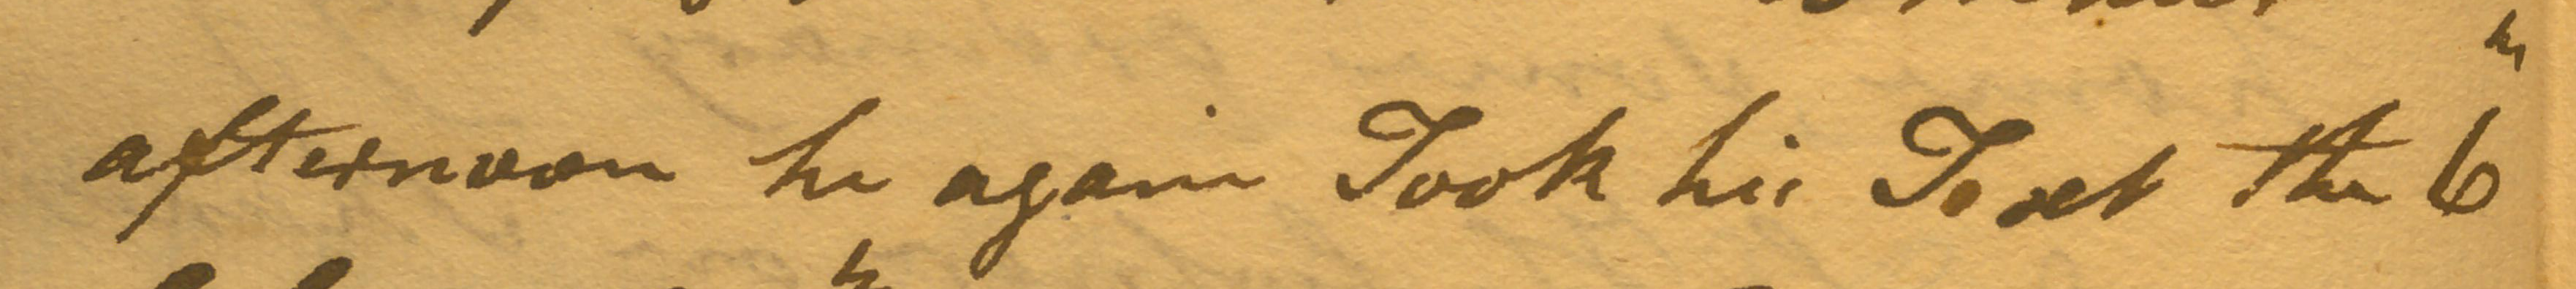afternoon he again Took his Text the 6
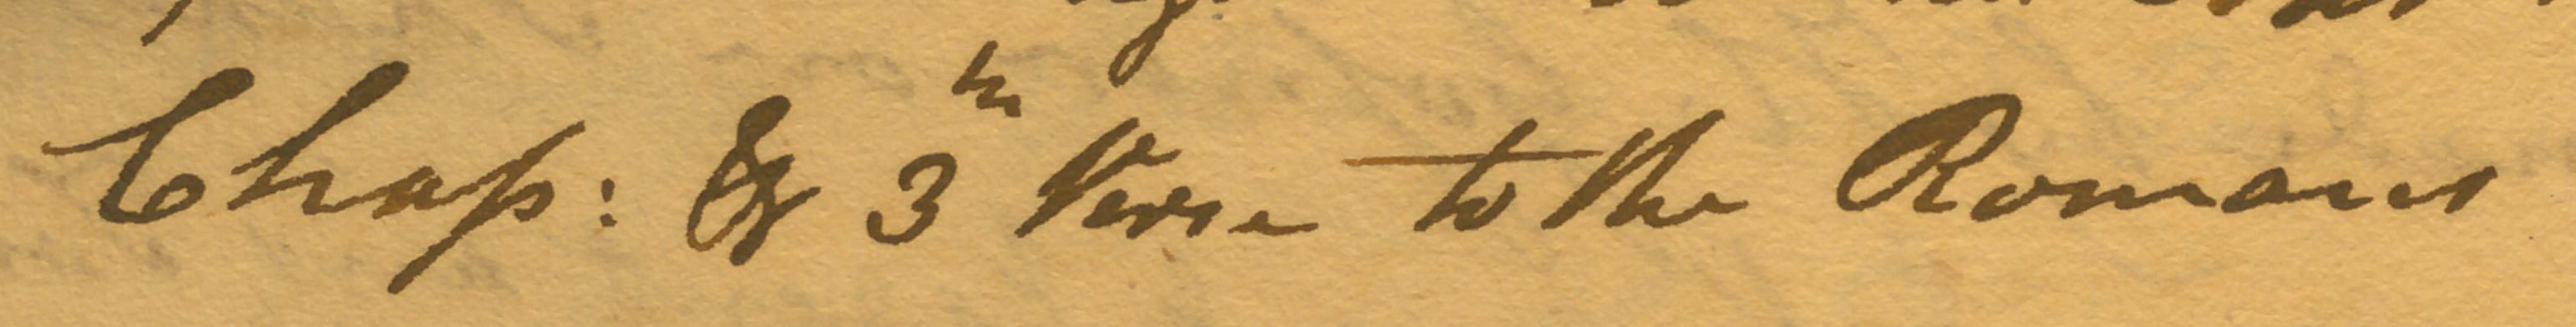Chap: & 3^th Verse to the Romans
